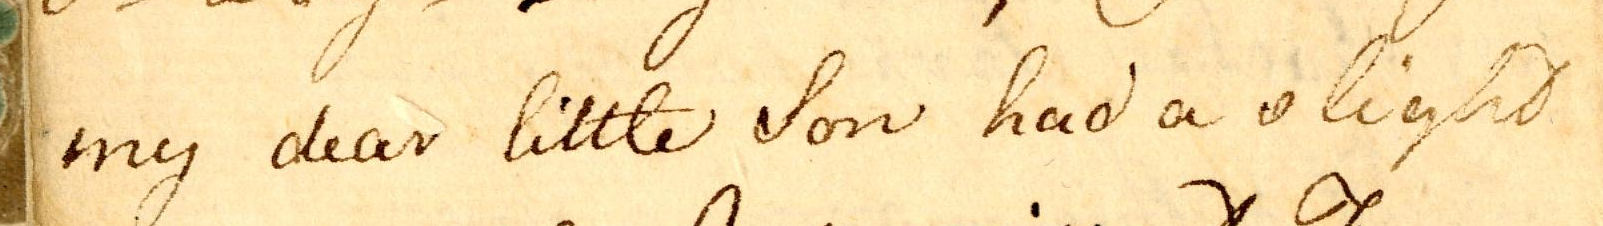my dear little Son a slight
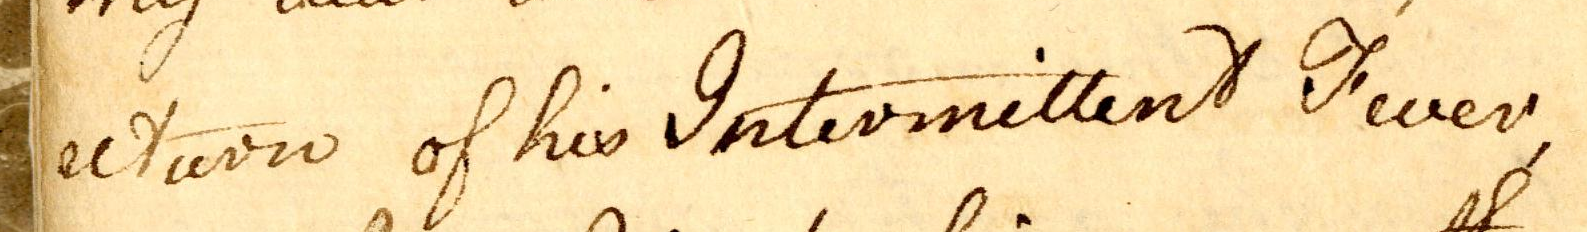return of his Intermittent Fever,
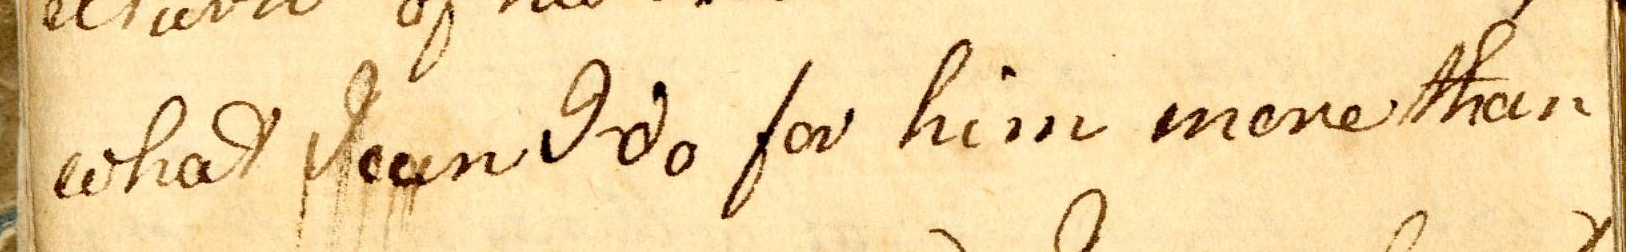what I can I do for him more than
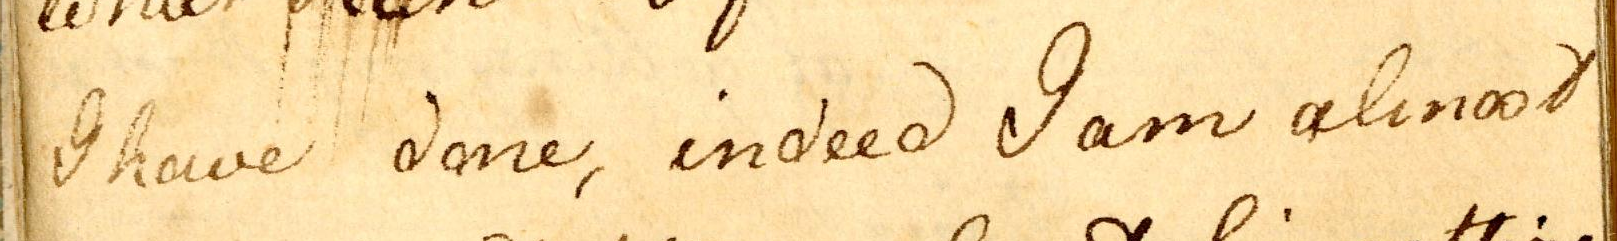I have done, indeed I am almost
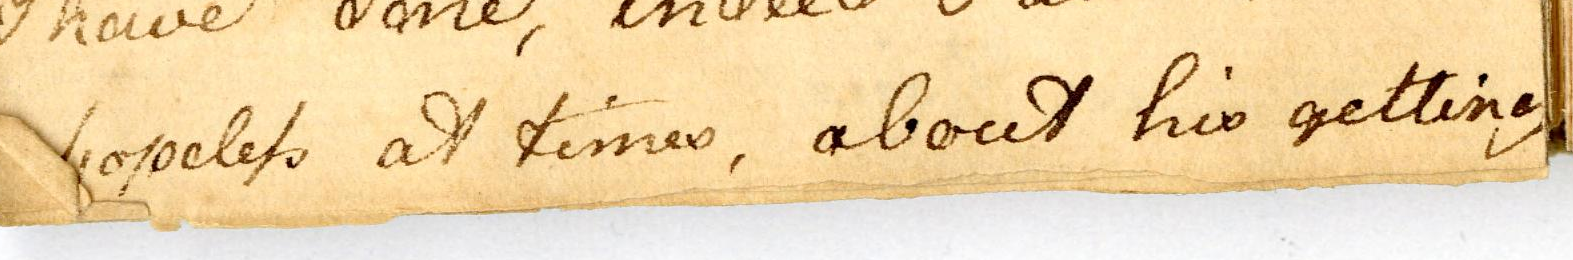hopeless at times, about his getting
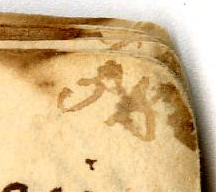51
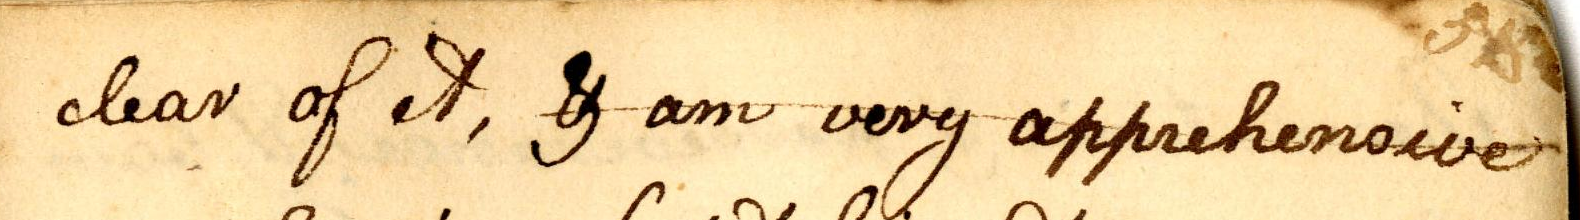clear of it, & am very apprehensive
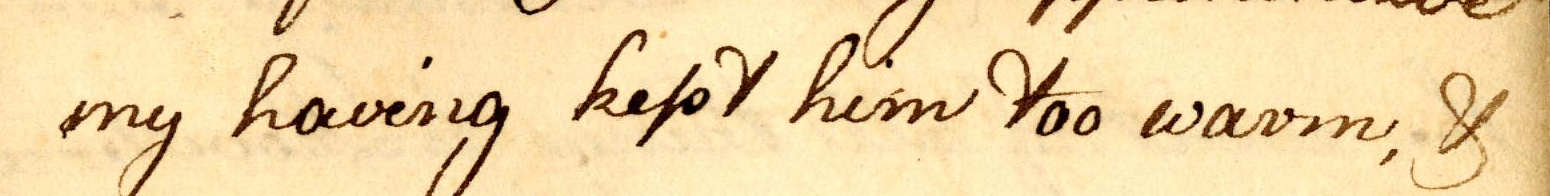my having kept him too warm, &
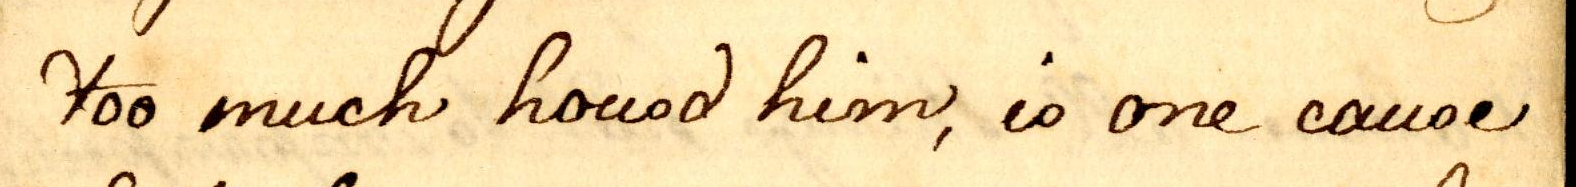too much housd him, is one cause
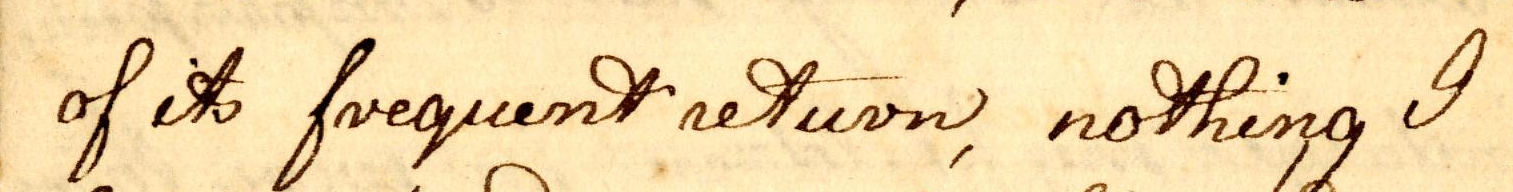of its frequent return, nothing I
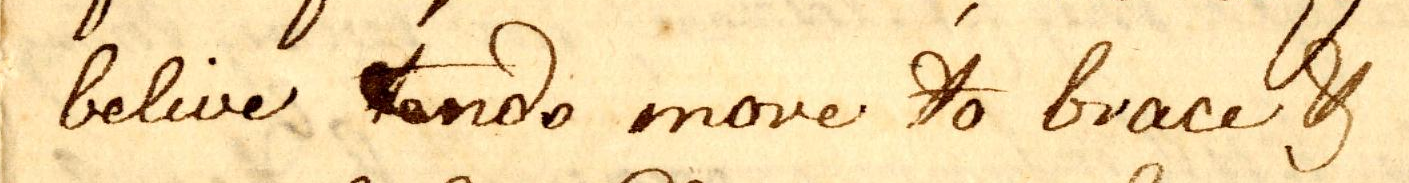belive tends more to brace &
